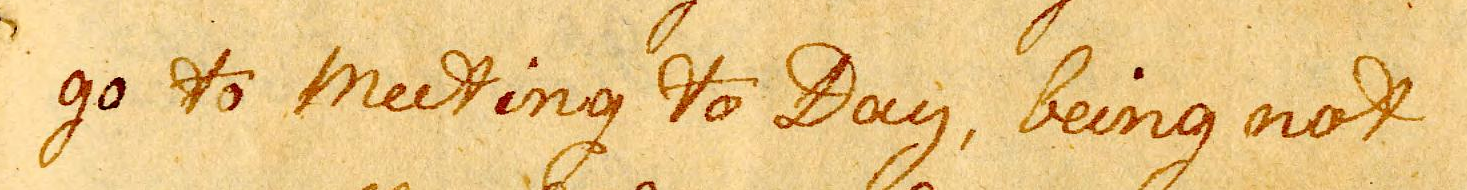go to Meeting to Day, being not
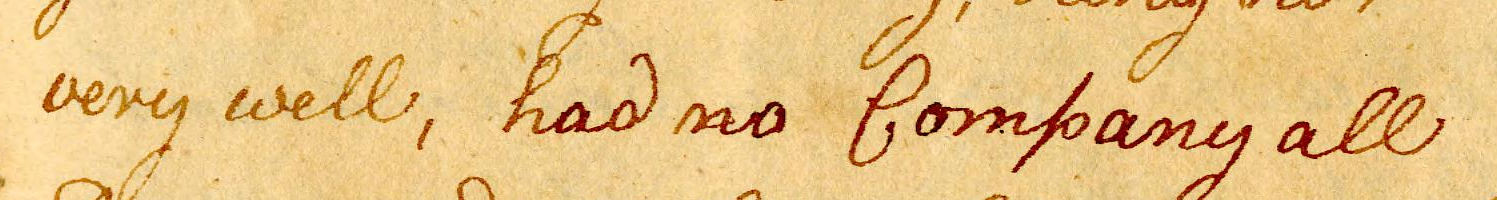very well, had no Company all
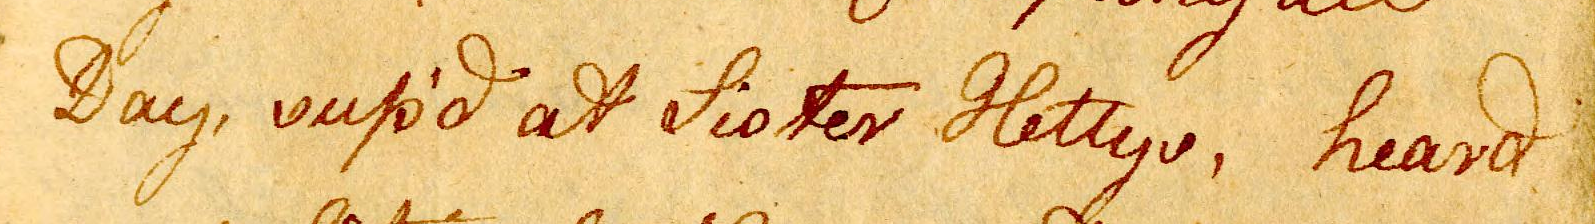Day, sup'd at Sister Hettys, heard
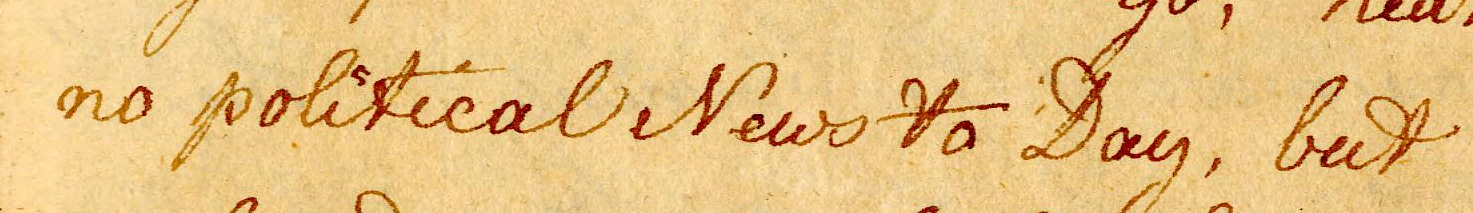no political News to Day, but
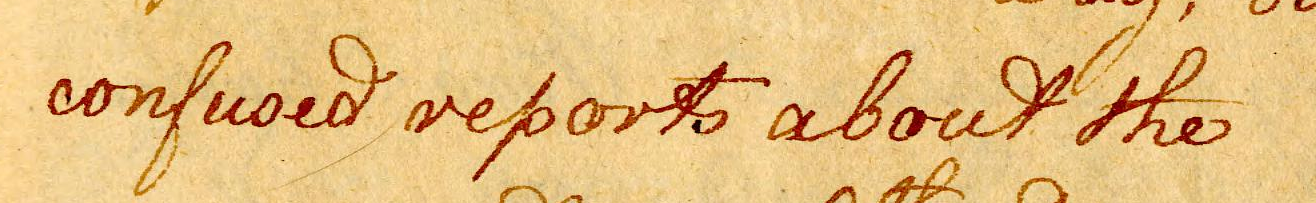confused reports about the
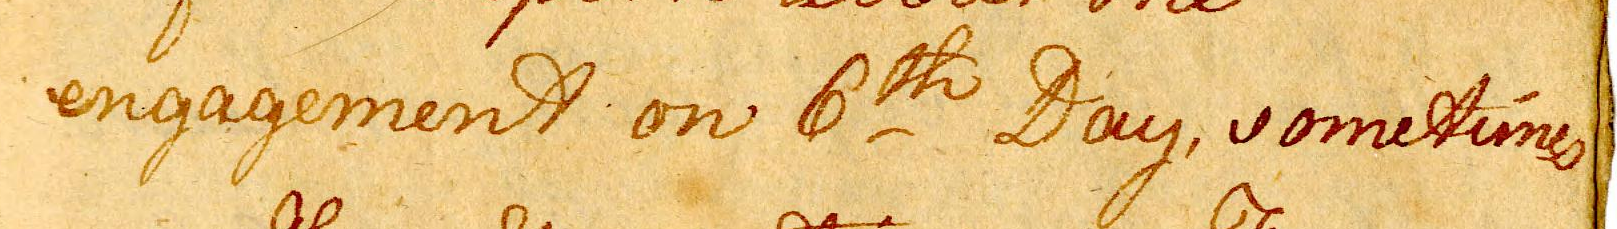engagement on 6^th Day, sometimes
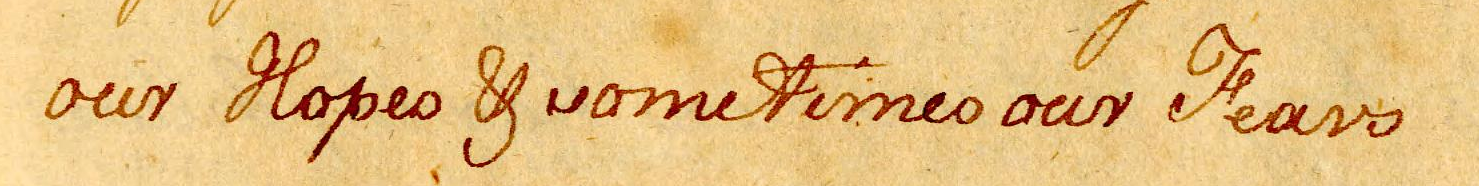our Hopes & sometimes our Fears
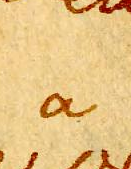a
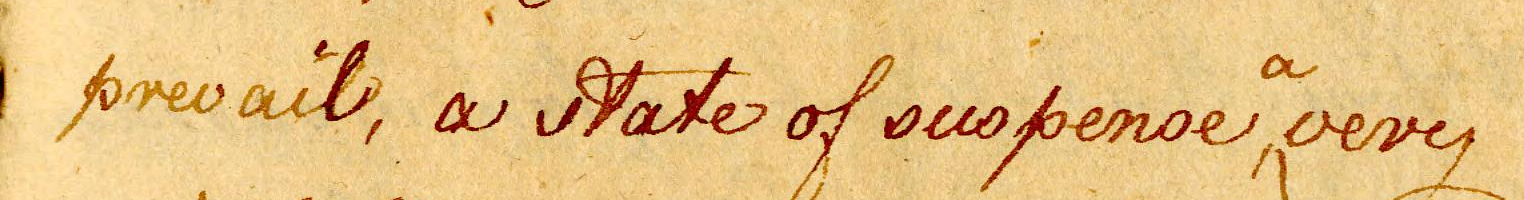prevail, a state of suspense ^ very
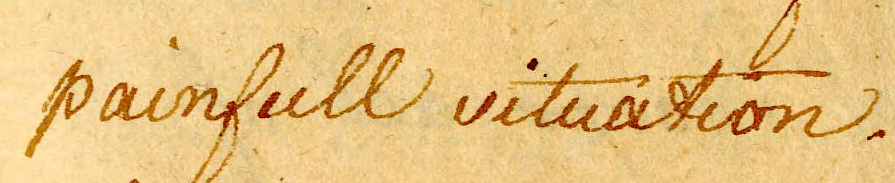painfull situation.
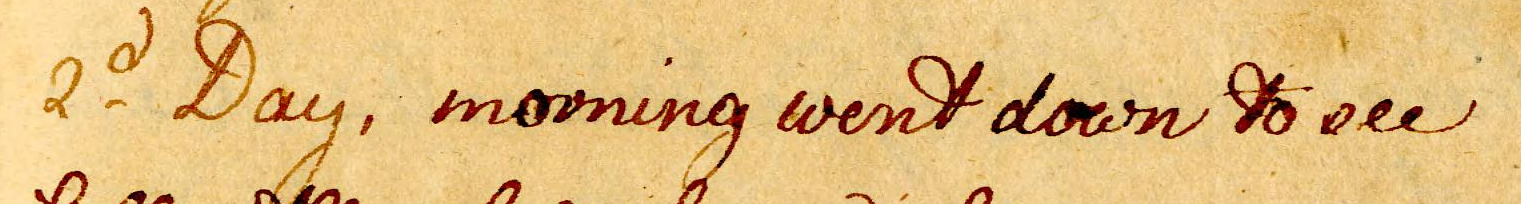2^d Day, morning went down to see
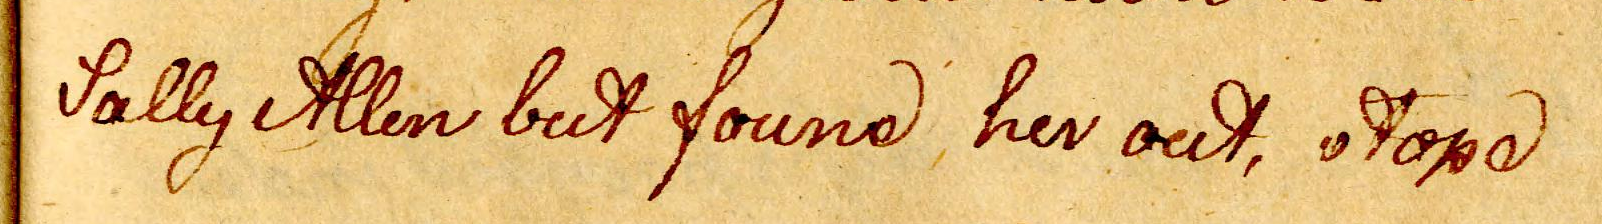Sally Allen but found her out, stopd
